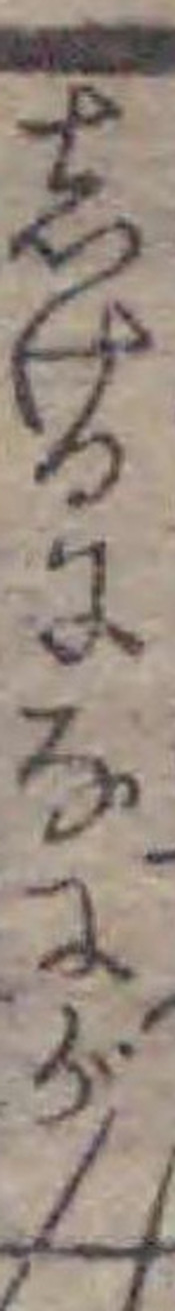しけるになにが
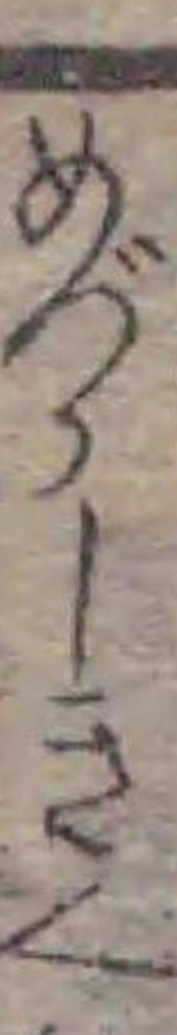めづらしき
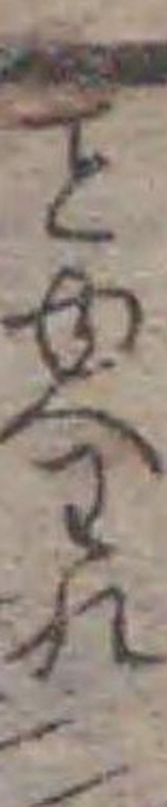ことゆへわれ
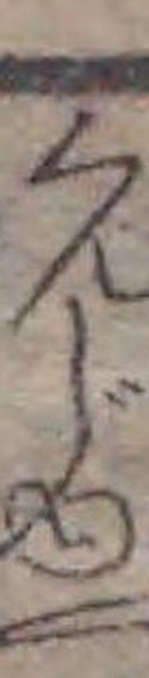ぐんじゆ
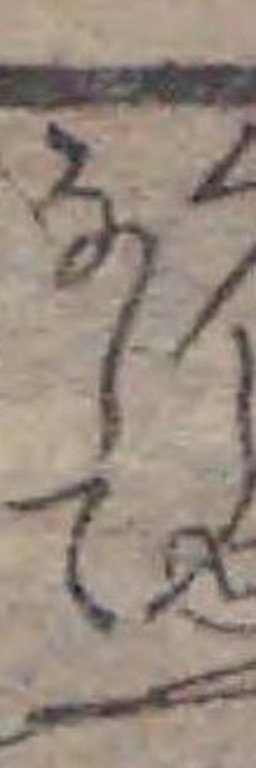なして
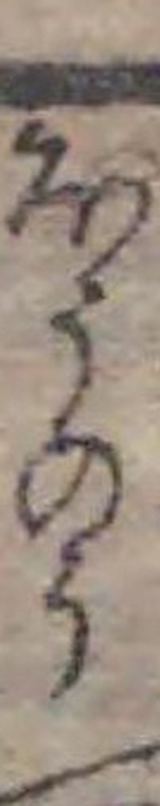ほうのう
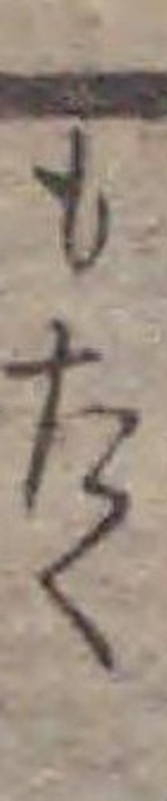もたく
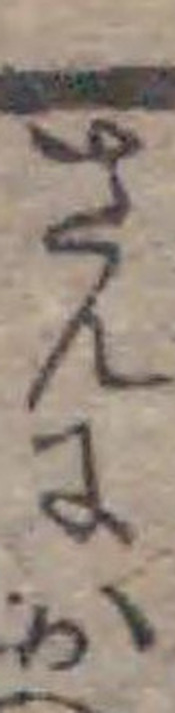さんにお
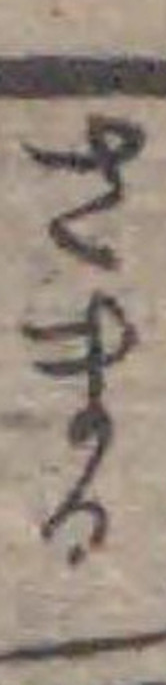さまる
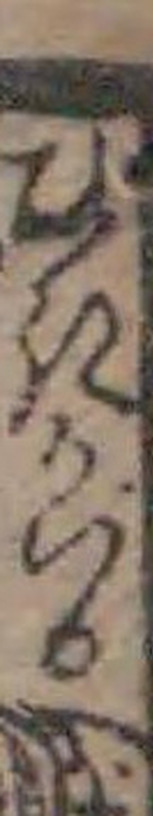ひきかいる
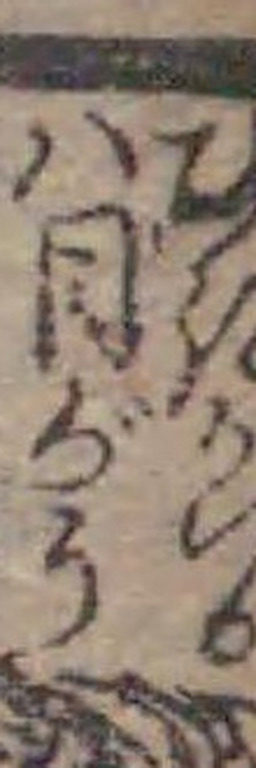は目がう
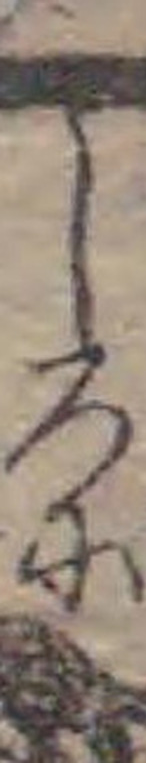しろに
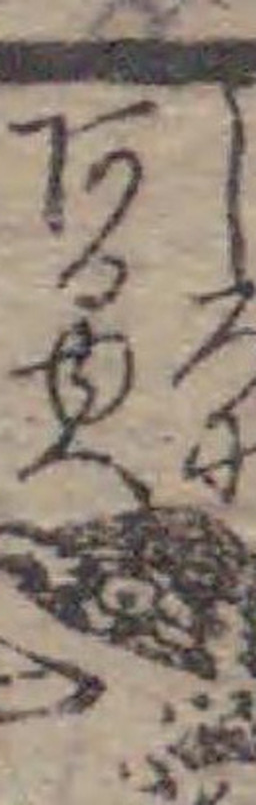あるゆへ
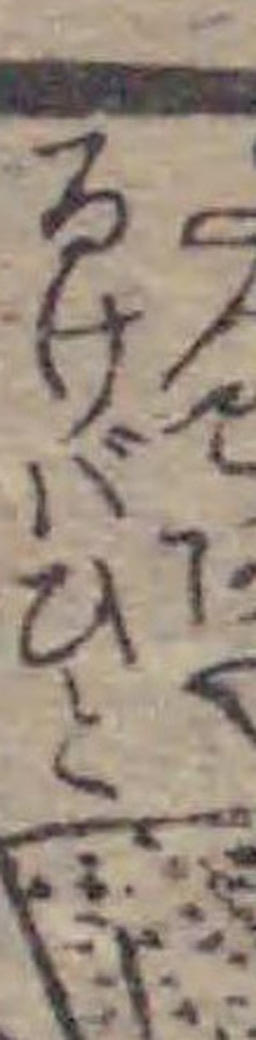るけばひと
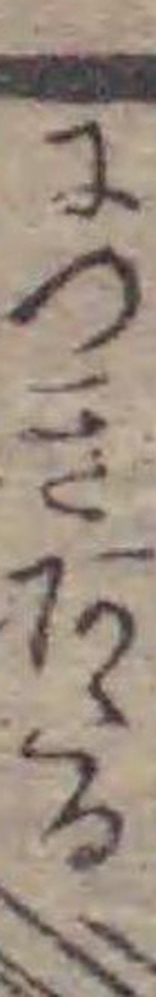につきあたる
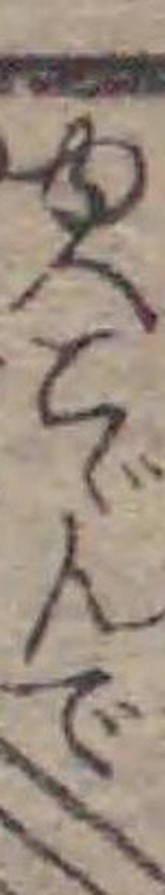ゆへこゞんで
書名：化物七段目 : 2巻
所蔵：国立国会図書館 National Diet Library, JAPAN
